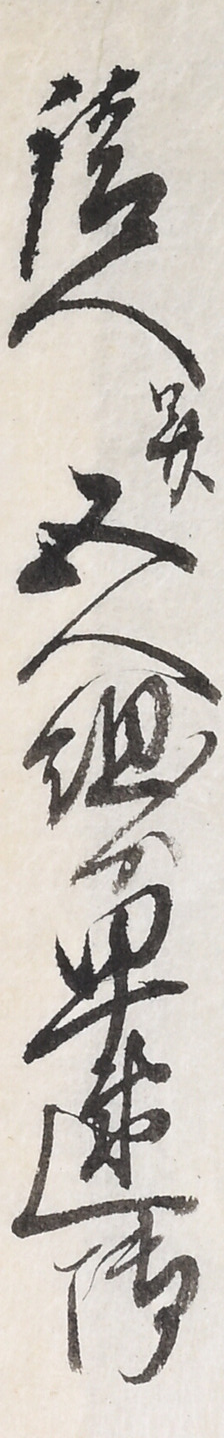請人并五人組ゟ早速御
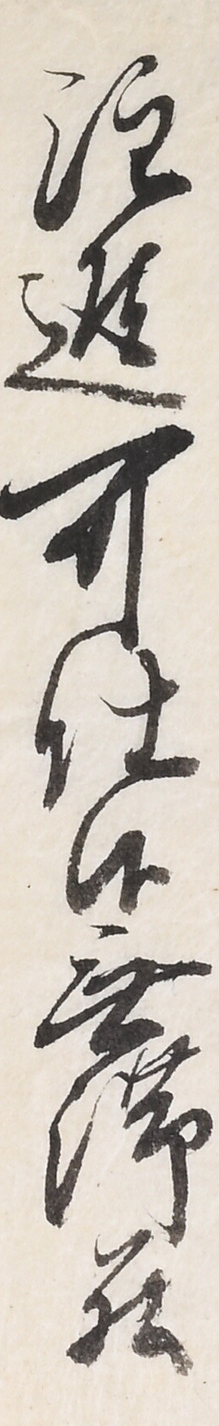注進可仕候無滞罷
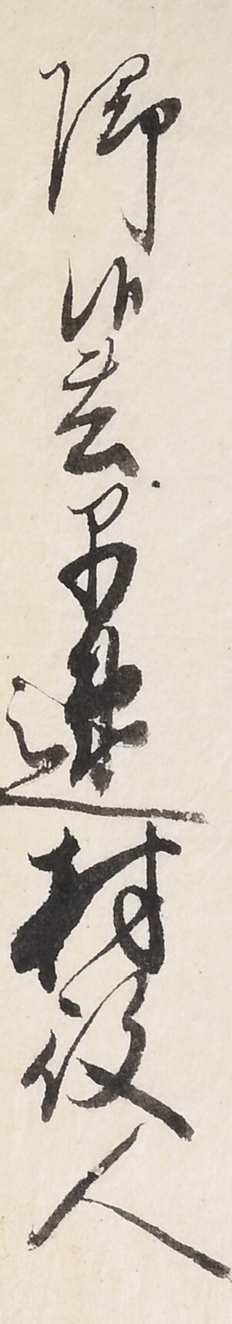帰候共早速村役人
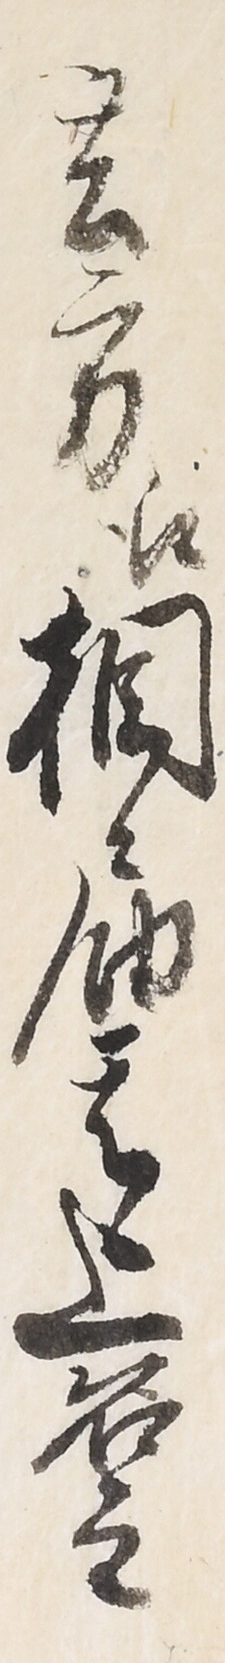共方江相届其上名主
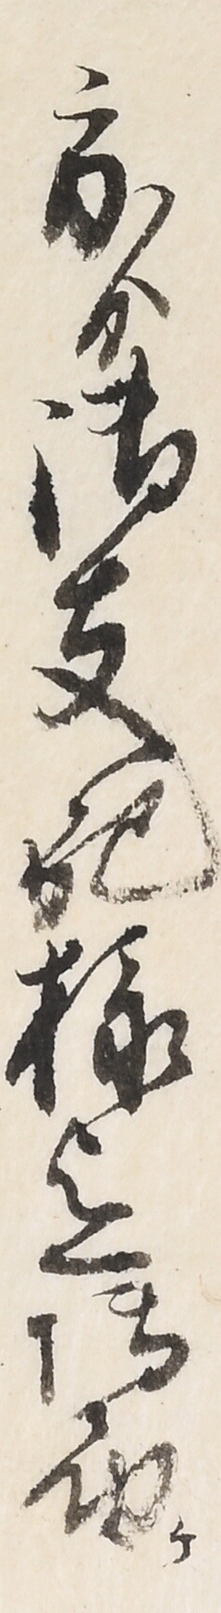方ゟ御支配様迄御届ケ
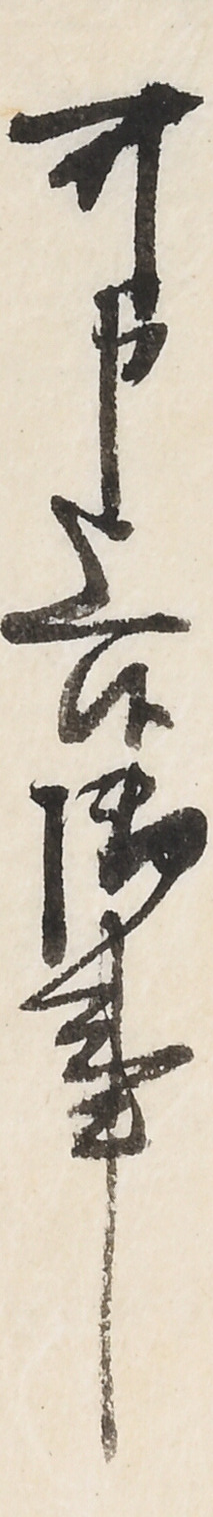可申上候御事
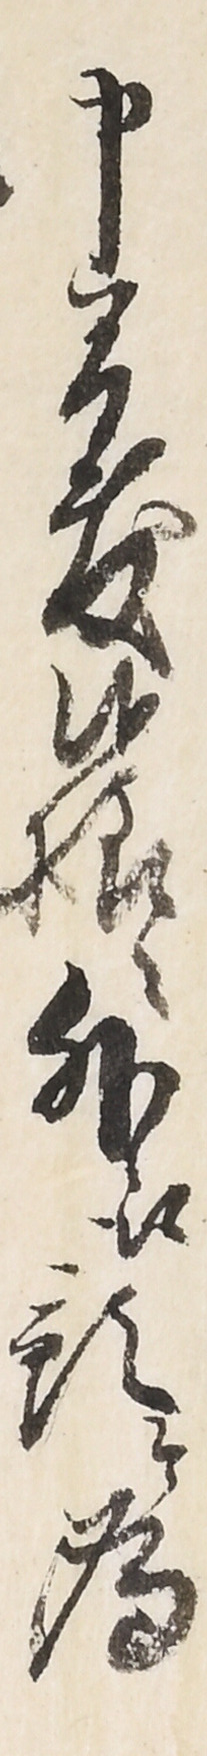申間敷候様ニ外江預ケ為
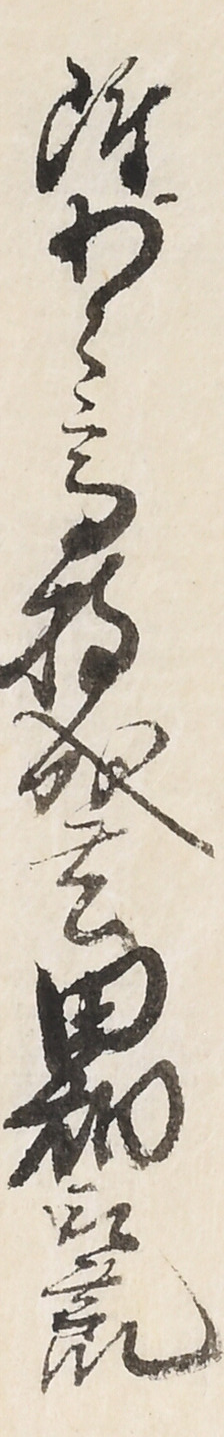附少々高持成共田畑被荒
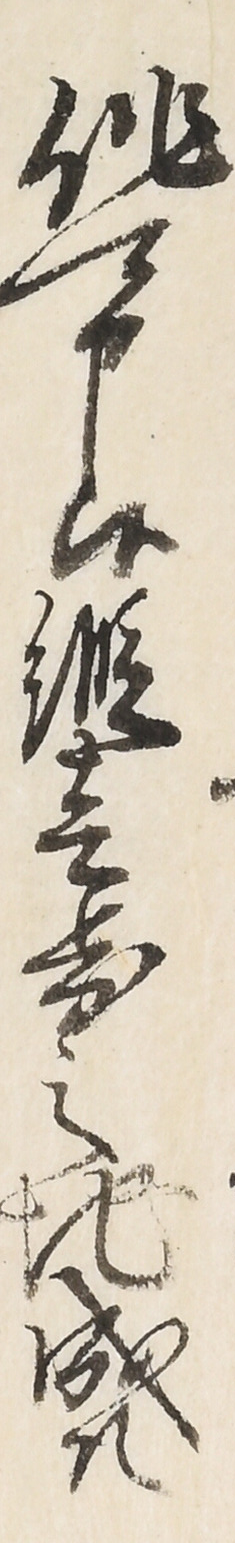作可申候縦壱歩之地成共
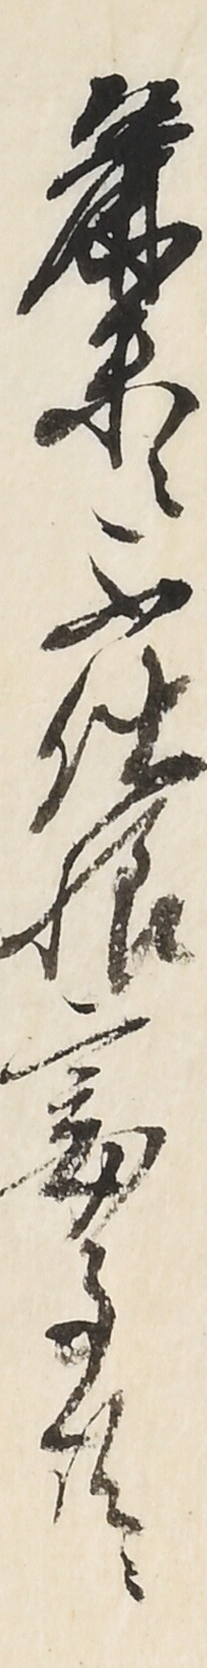麁末ニ不仕様妻子共ニ
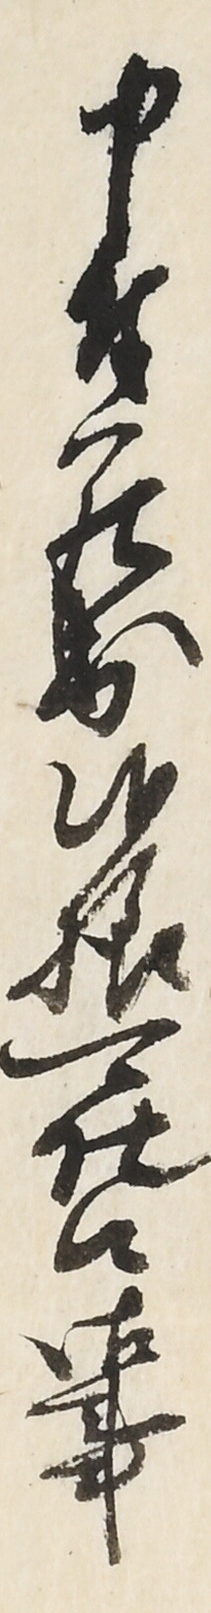申付罷出候様可仕候御事
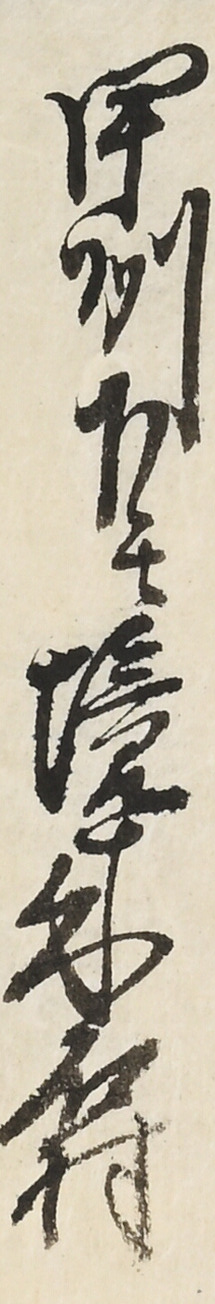甲州下モ境来石村
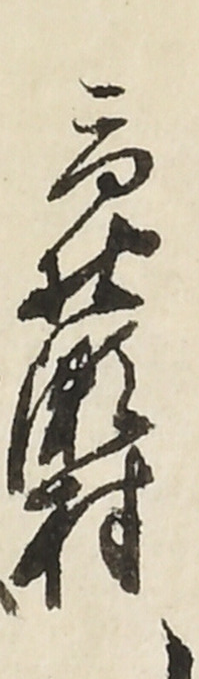市野瀬村
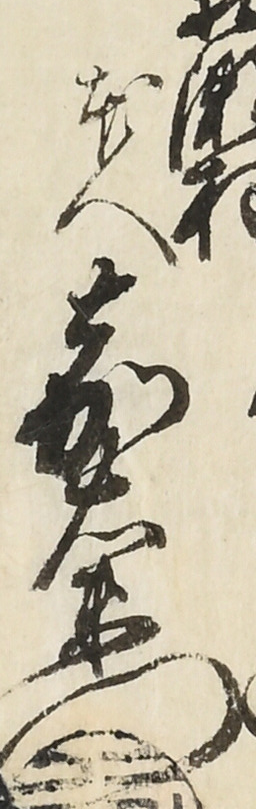本人嘉右衛門㊞
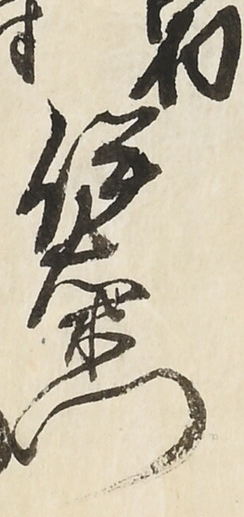伊右衛門

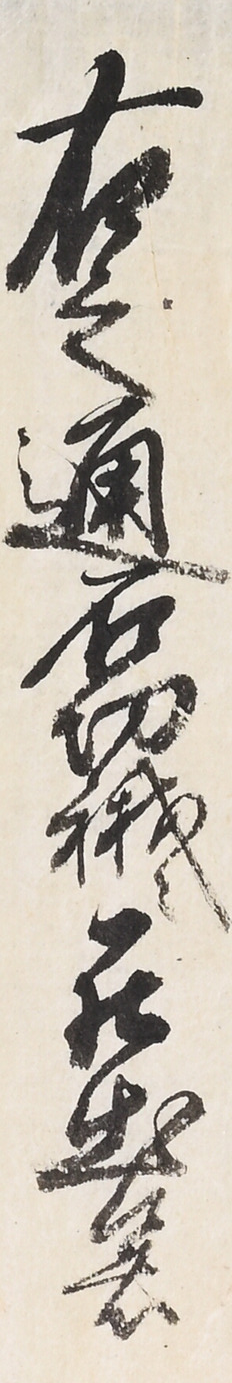右之通石切稼ニ罷出候者
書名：安政七庚申年二月石切旅稼名前書上帳
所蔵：伊那市立高遠町図書館・合同会社AMANE
